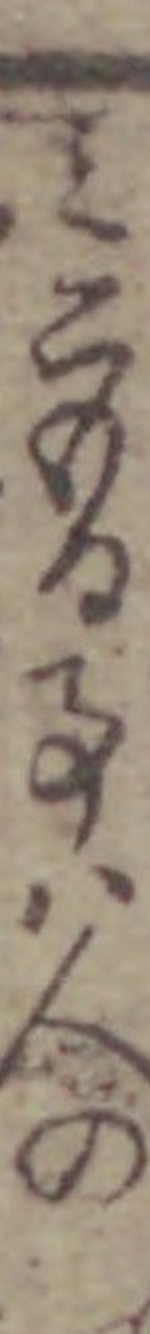みこもる事は人の
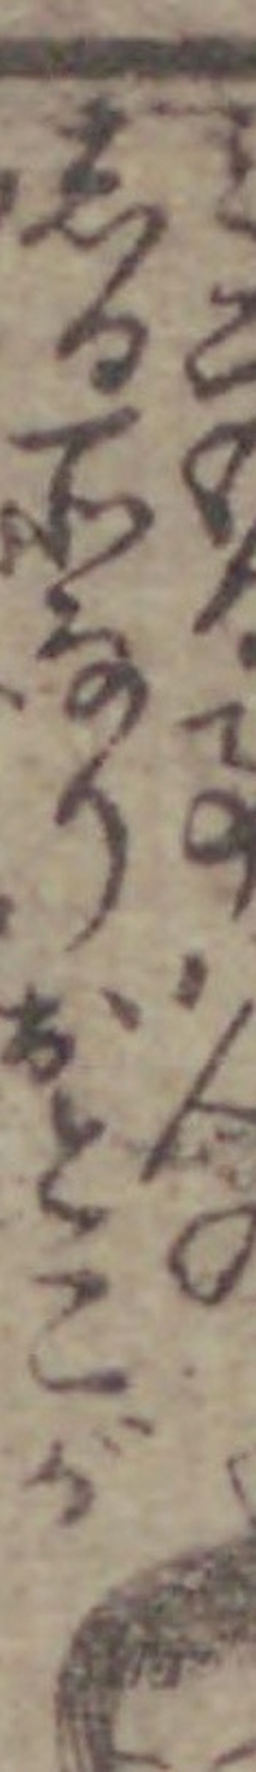しる所なりおとこが
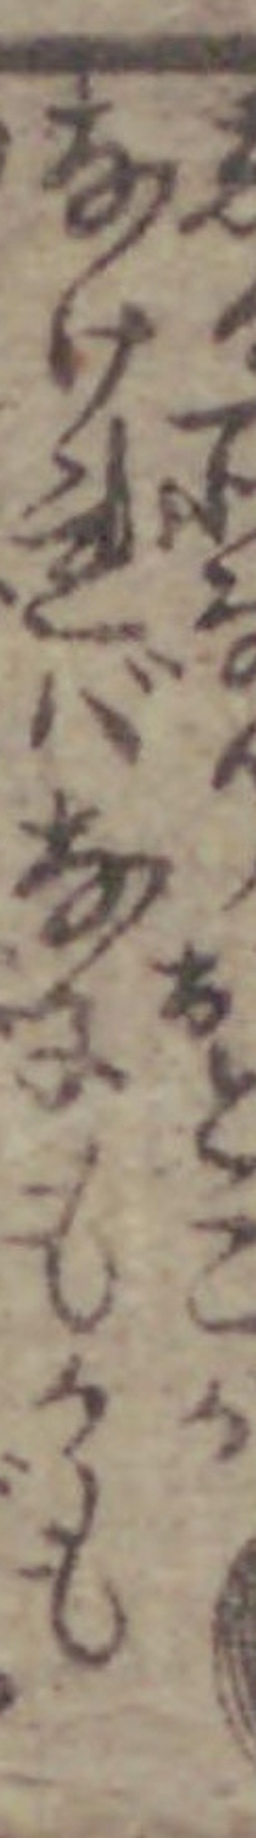なければなにもかも
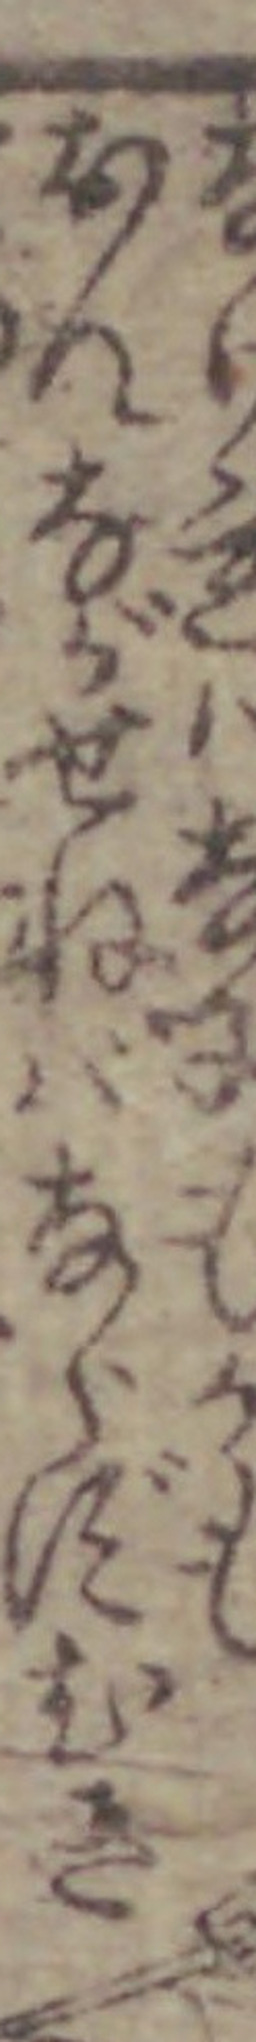おんながせねばならずむき
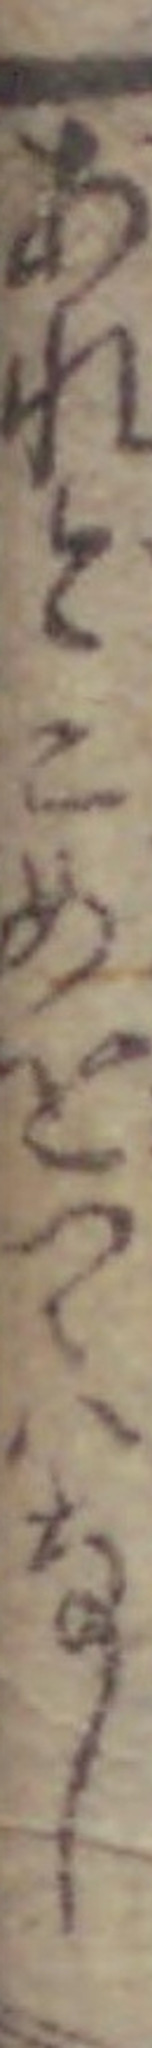あれどこめをつくはなし
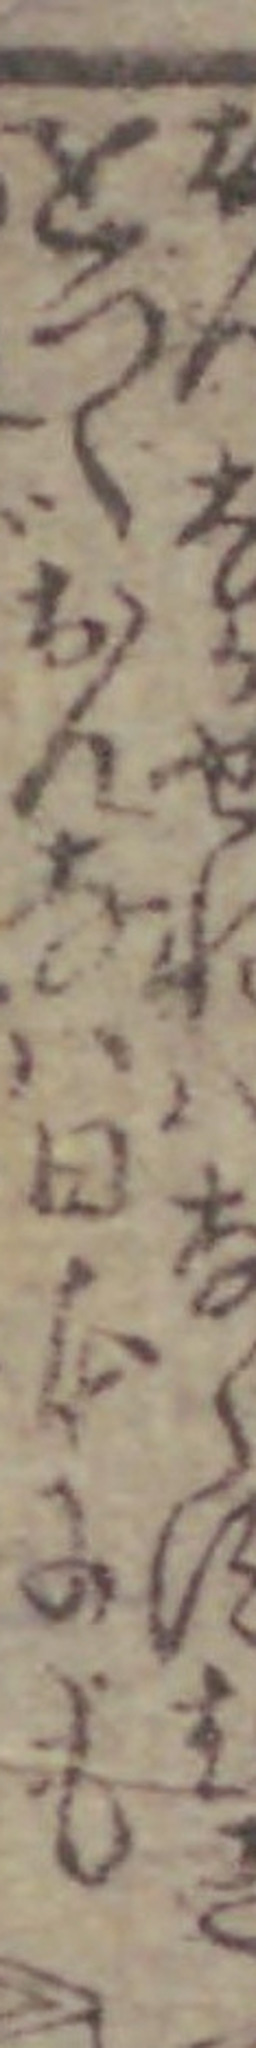をつくおんなは日本にも
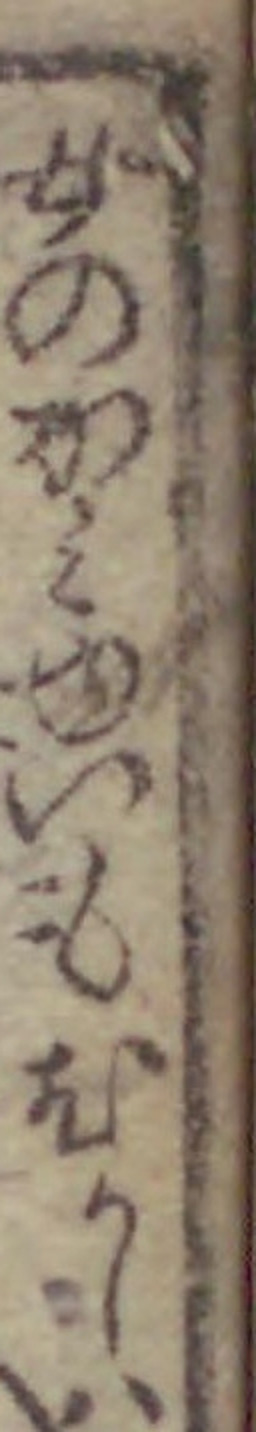女のかみゆいもむかしは
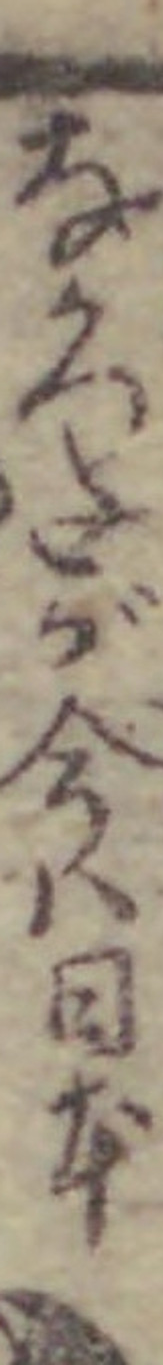なかつたが今は日本
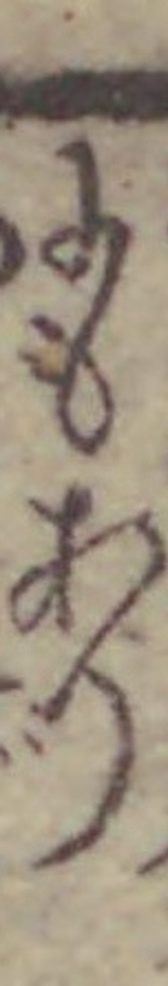にもあり
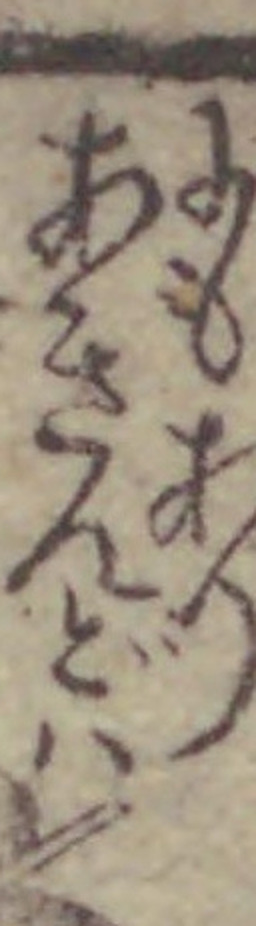あきんどは
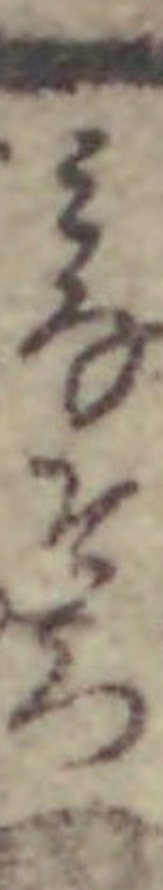みなそろ
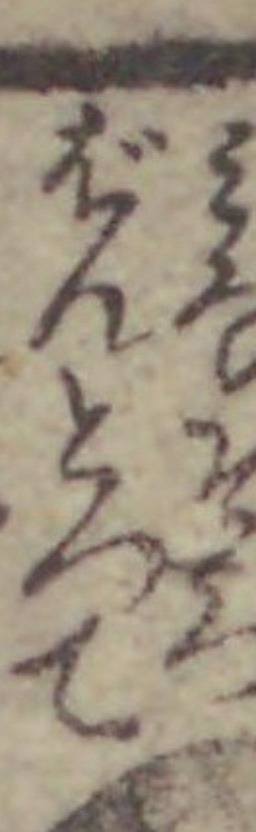ばんとつて
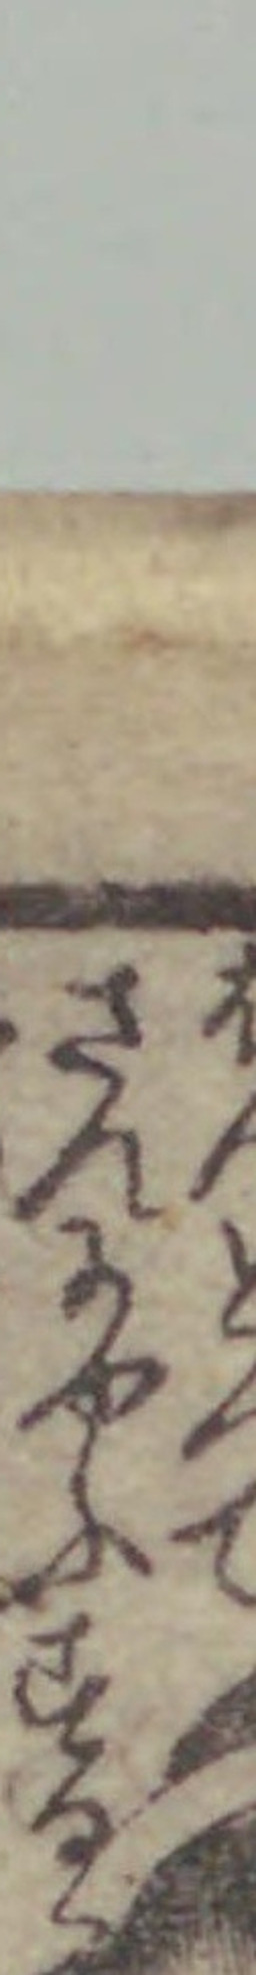さんにやふする
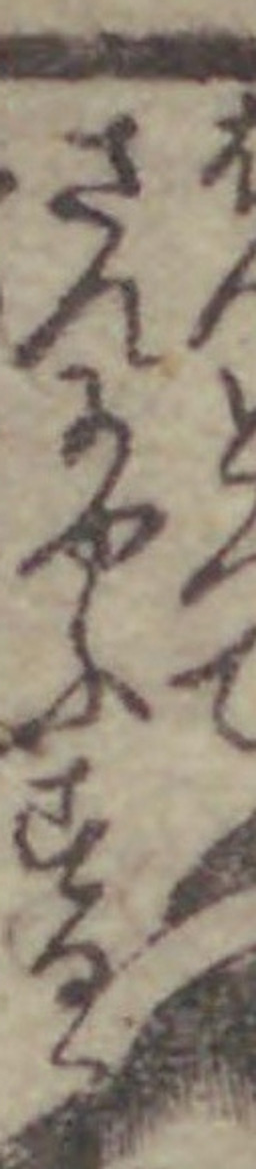さんにやふする
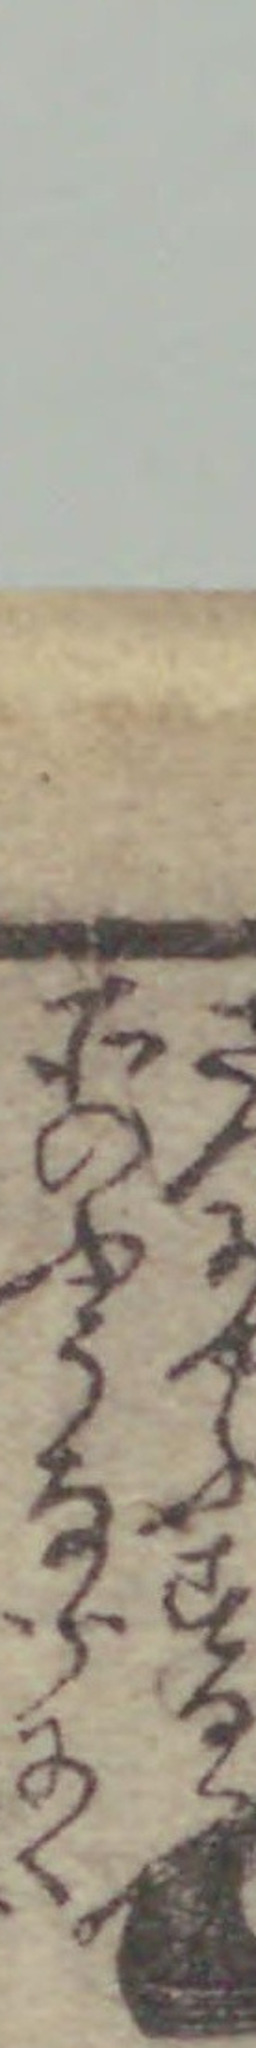所のふうならにく
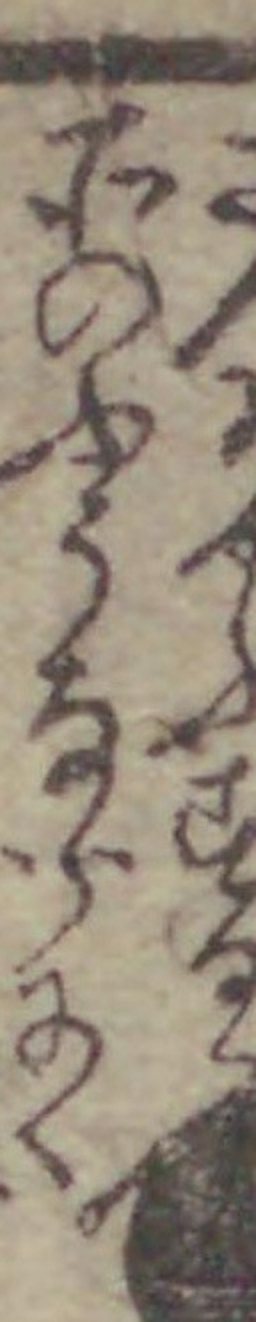所のふうならにく
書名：近頃嶋めぐり 3巻
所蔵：国立国会図書館 National Diet Library, JAPAN
